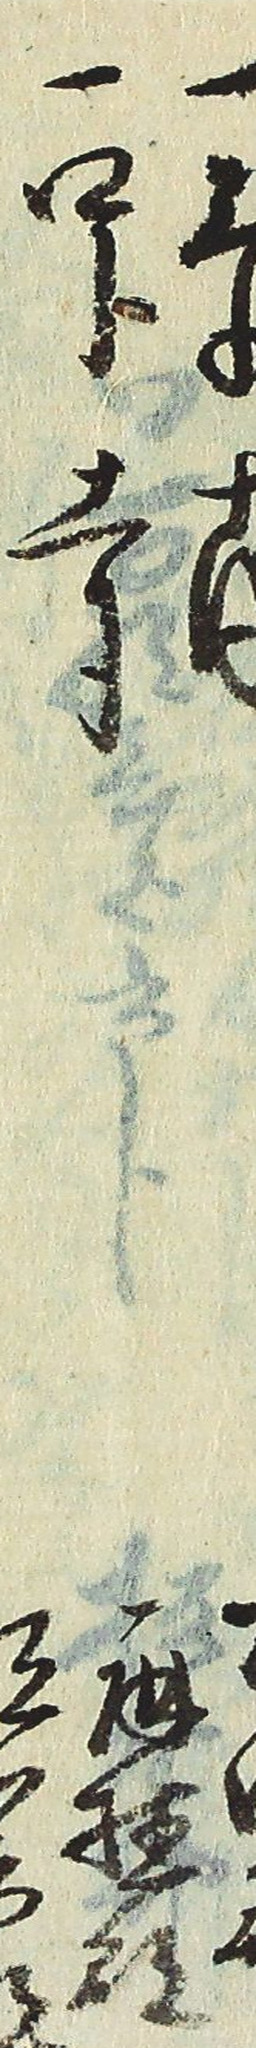一三月十月麻植郡
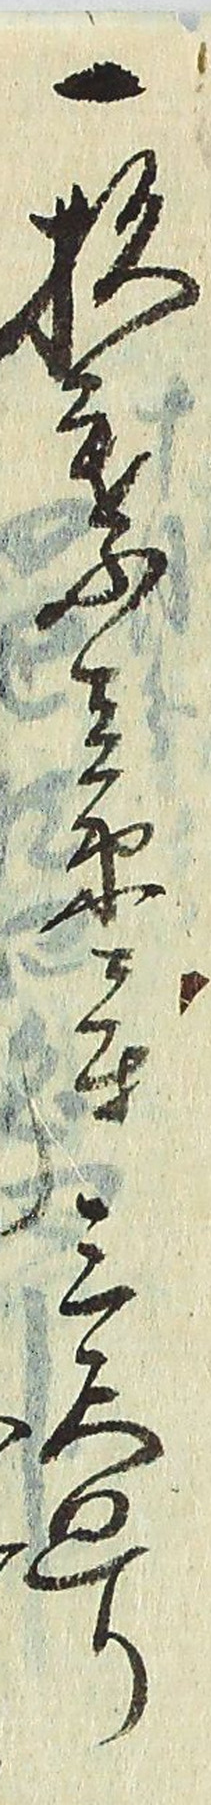一杉葉壱束に付三尺廻り
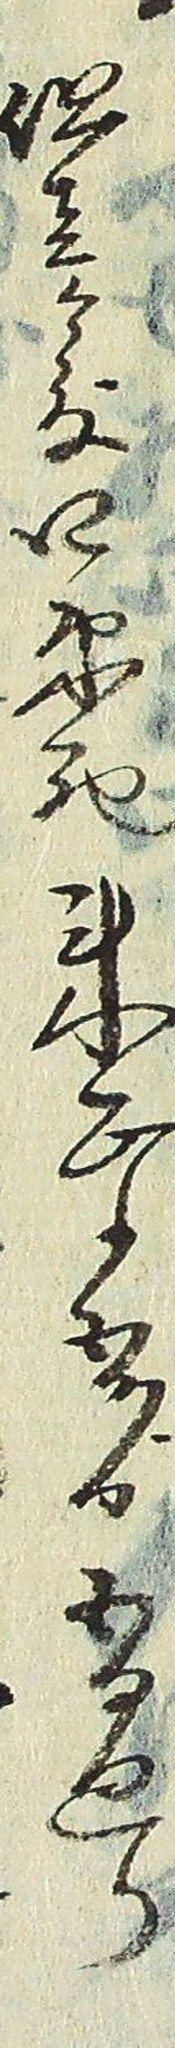但壱ヶ度四束宛来正月五日ゟ五日廻り
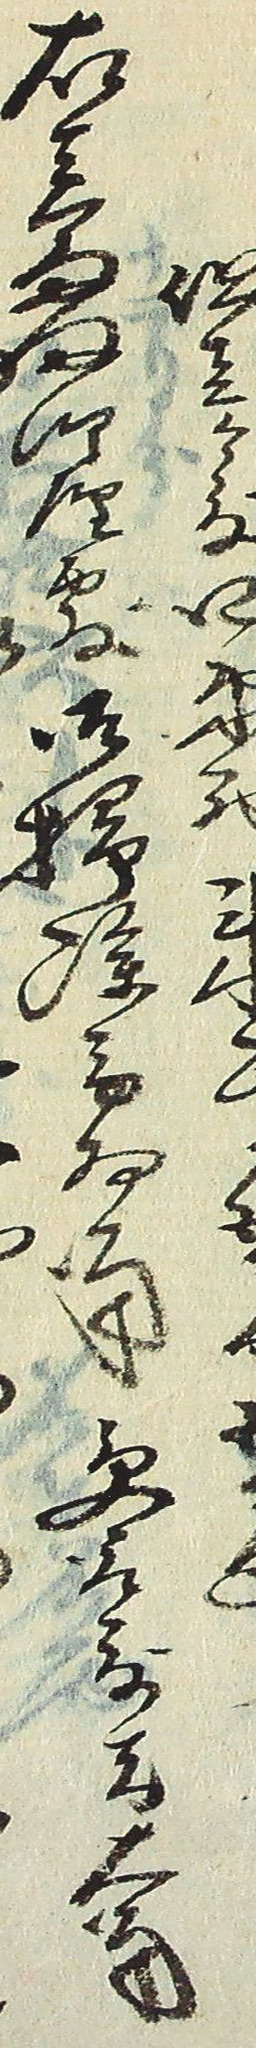右は富田御座敷御掃除方為御用受取度旨右御用
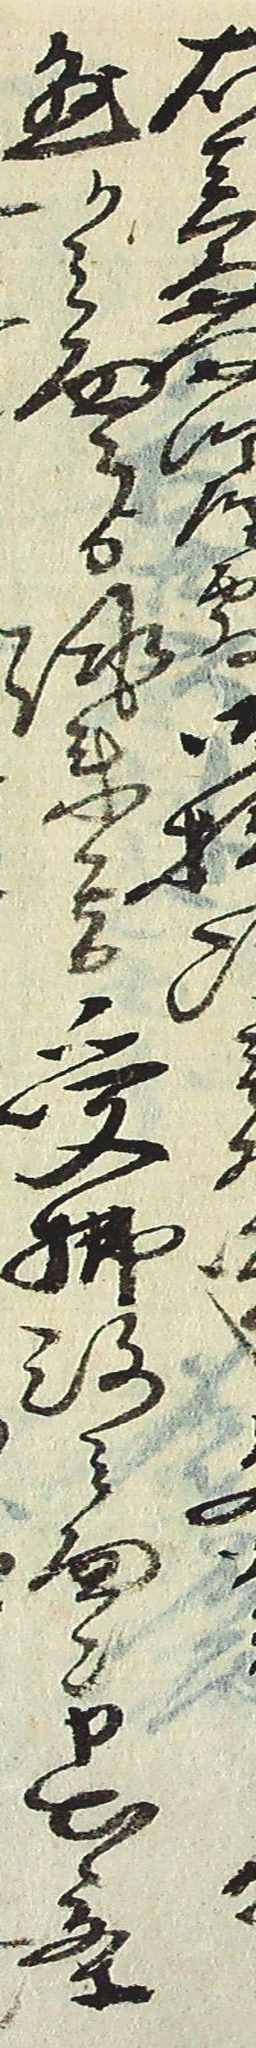懸り之面々ゟ誂来候旨受払役之面々申出候条
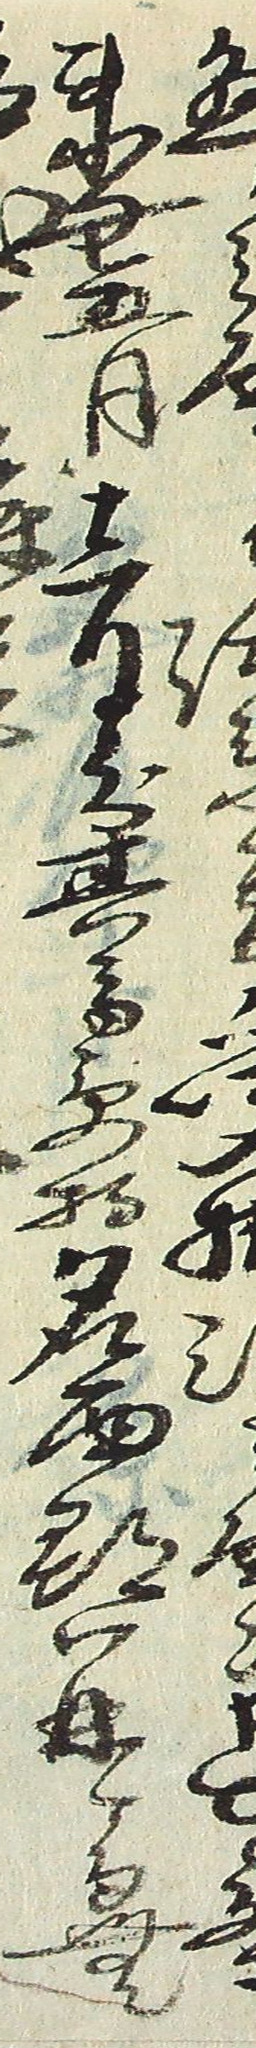来丑五月十二月分其方受持名西郡御林にて無
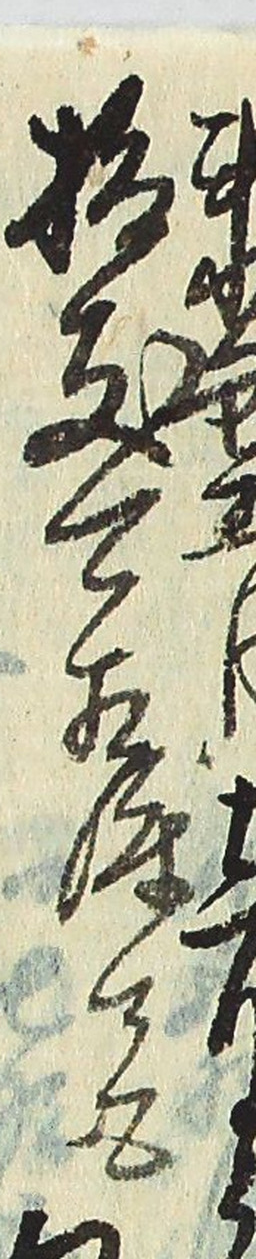指支可相附候以上
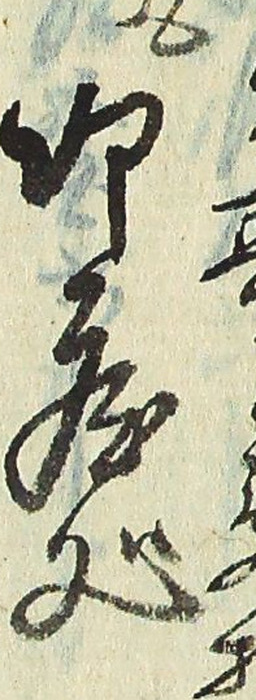御蔵処
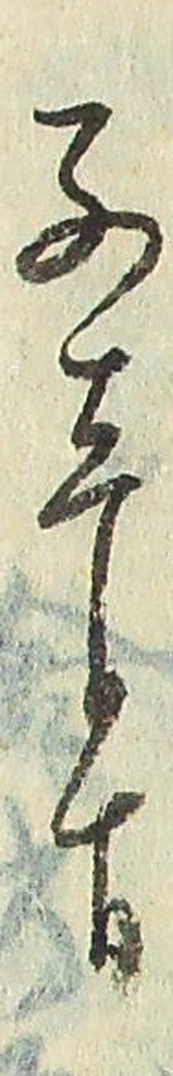子十二月十日
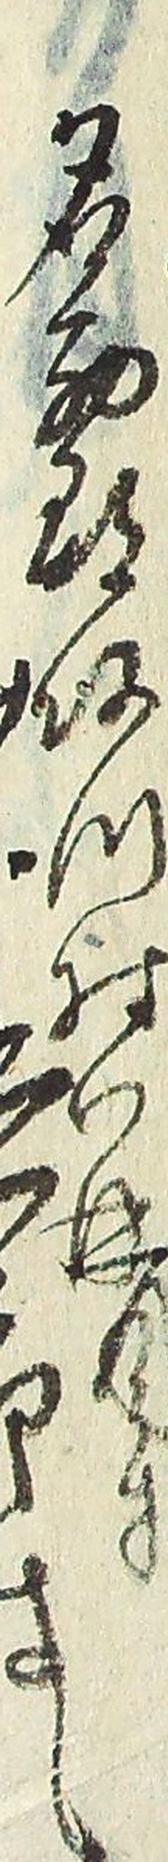名西郡阿川村御林目付
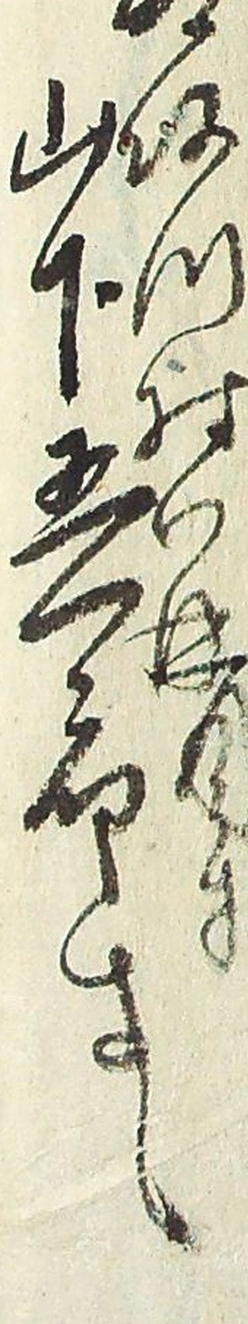山下五一郎方へ

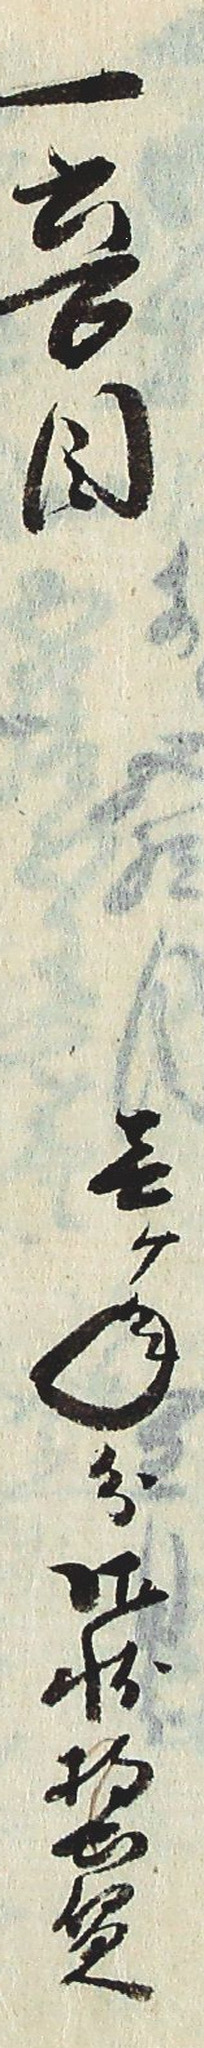一六百目壱ヶ年分御状持出賃
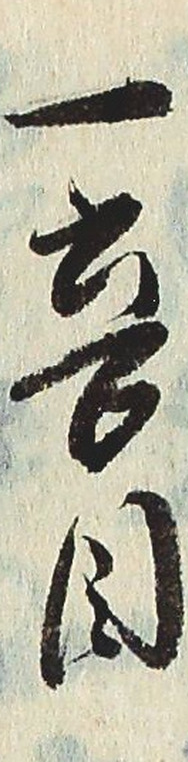合六百目
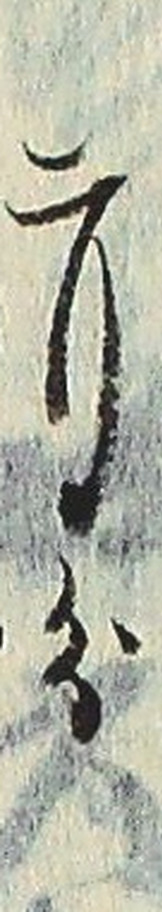二月分
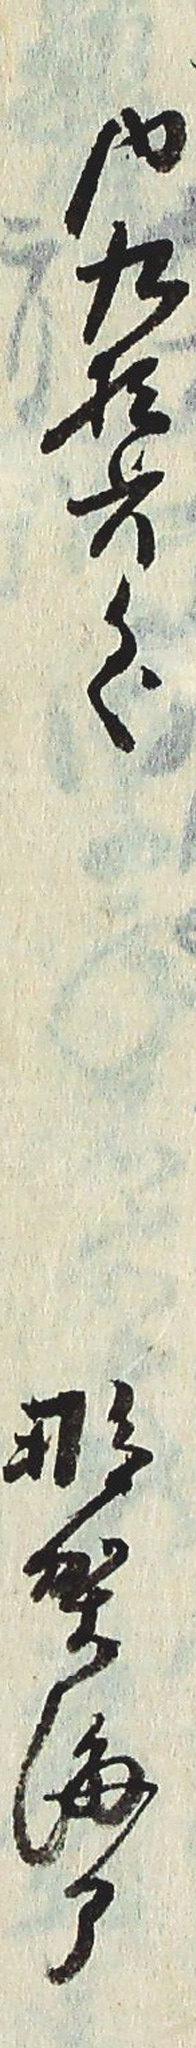内九拾六匁那賀海部
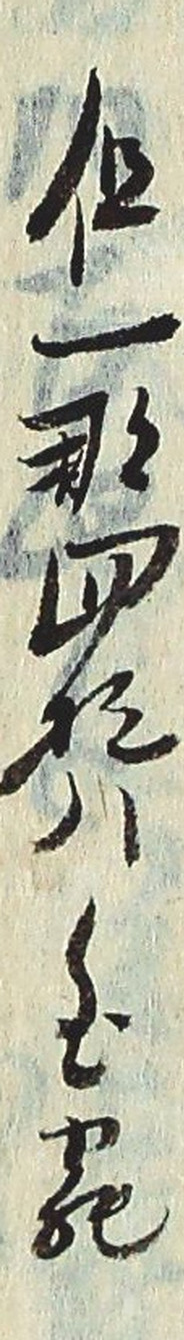但一郡四拾八匁宛
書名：名東郡中諸割賦元帳
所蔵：鳴門教育大学 Naruto University of Education
